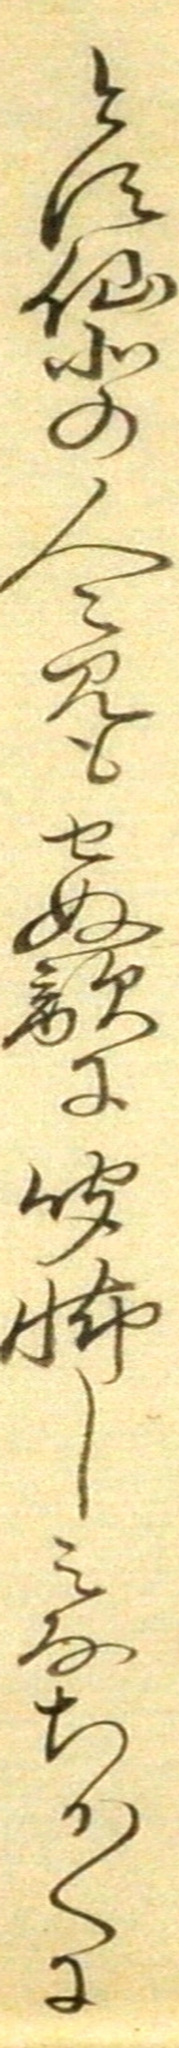とす仙北の人々見もせぬ敵に聞怖しみなちか〳〵に
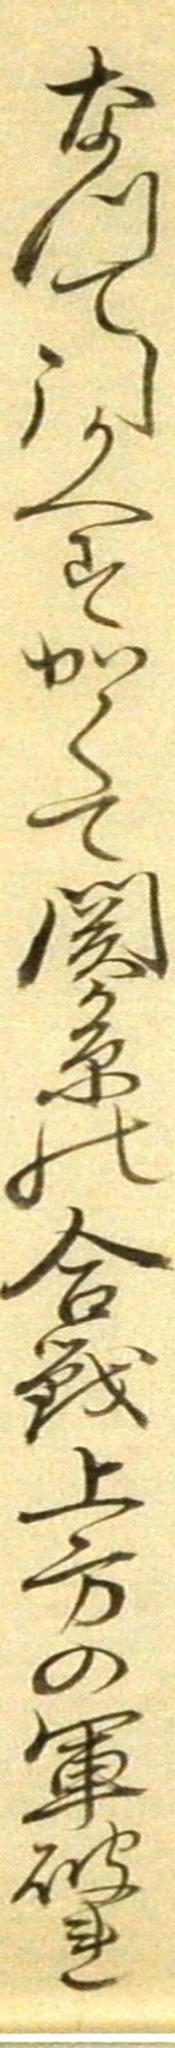なつて引かへすかくて関か原の合戦上方の軍破れ
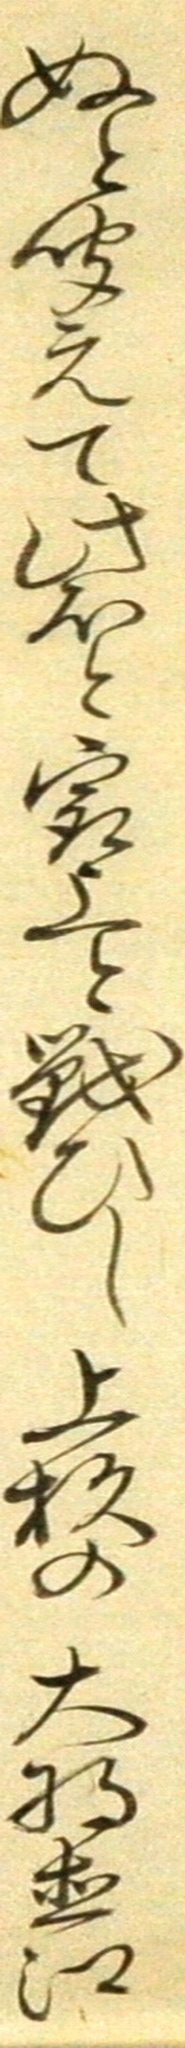ぬと聞えて此ほと最上と戦ひし上杉の大将直江
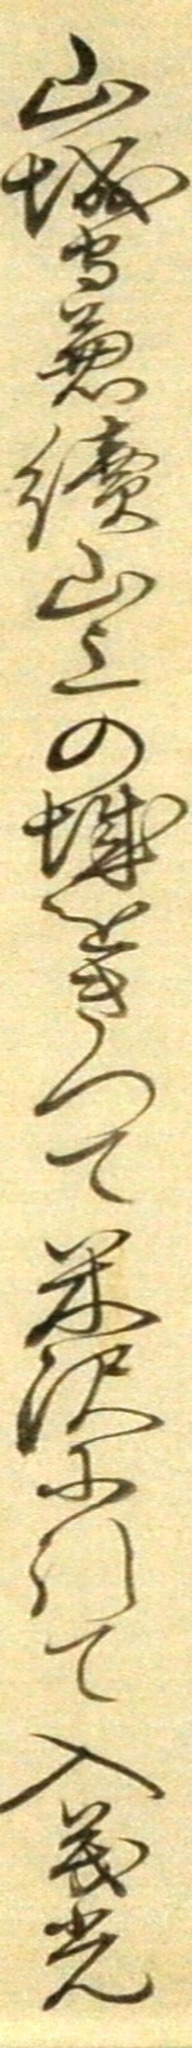山城守兼続山上の城をきつて米沢に引て入義光
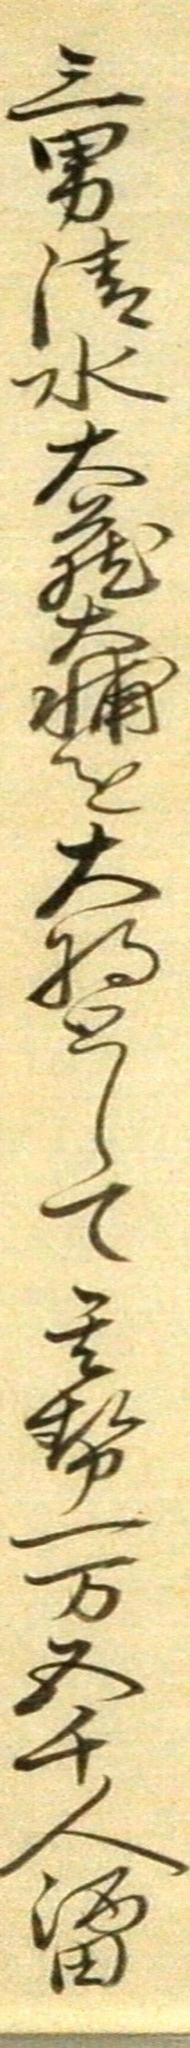三男清水大蔵大輔を大将として其勢一万五千人酒田
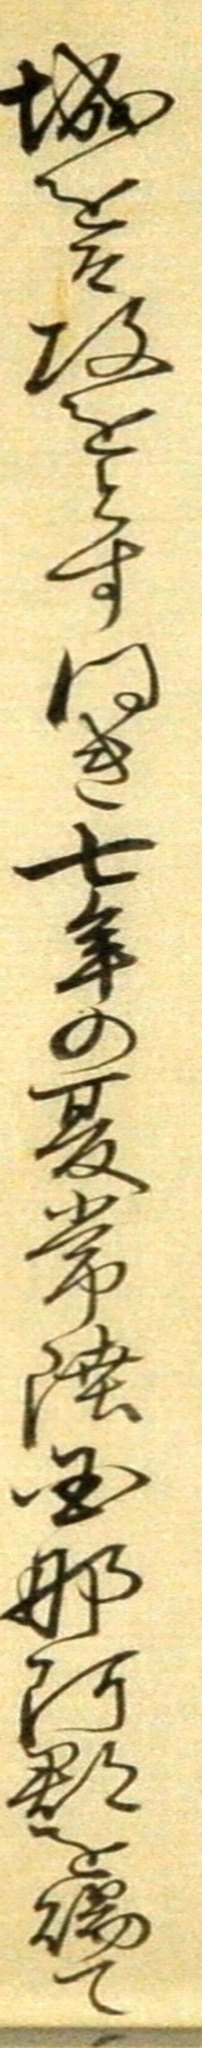の城をそ攻をとす同き七年の夏常陸国那珂郡を賜て
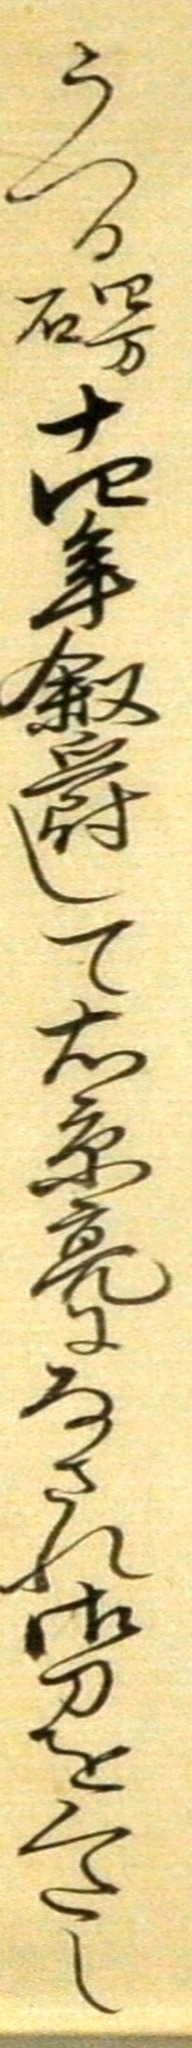うつる四万石十四年叙爵して右京亮になされ御刀をくたし
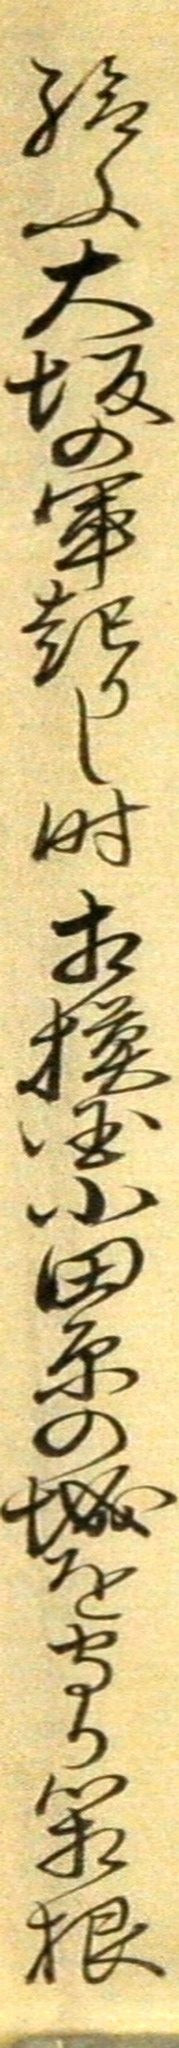給ふ大坂の軍起りし時相模国小田原の城を守り箱根

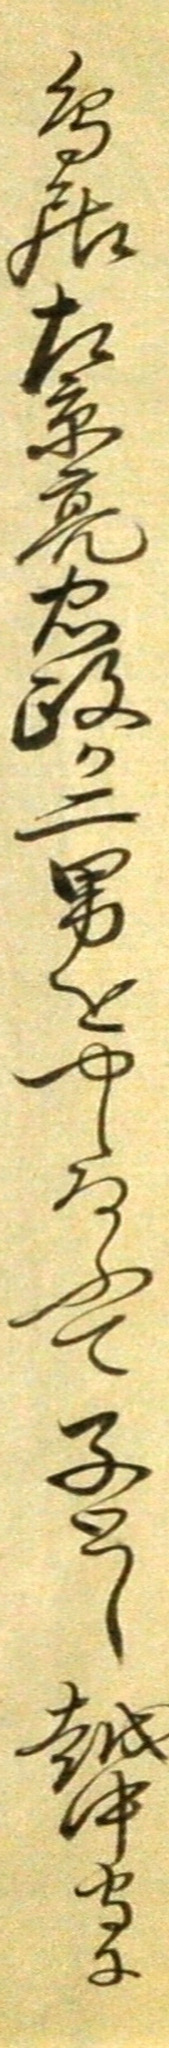鳥居左京亮忠政か二男をやしなふて子とし越中守に
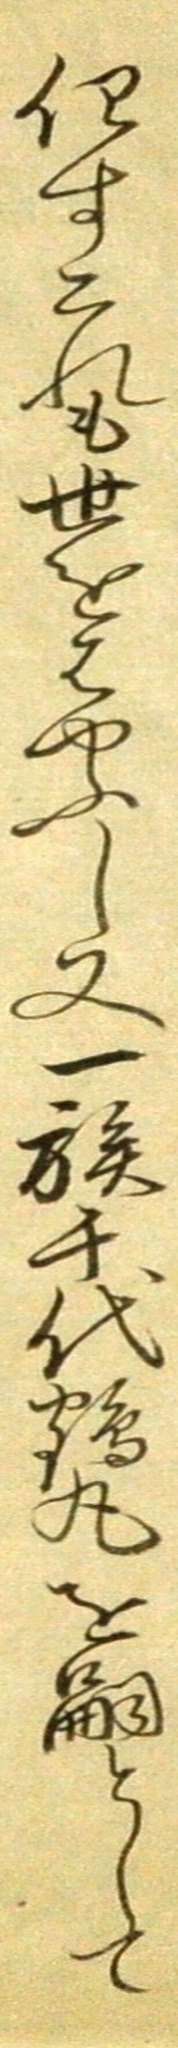任すこれも世をはやふし又一族千代鶴丸を嗣として
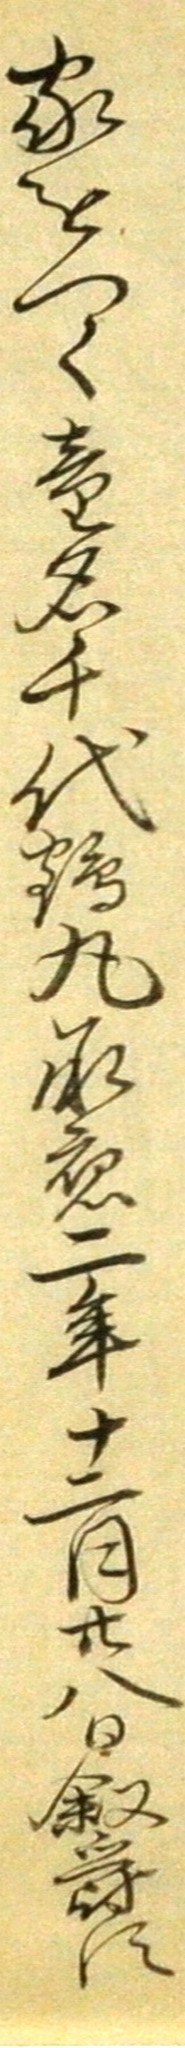家をつく童名千代鶴丸承応二年十二月廿八日叙爵す
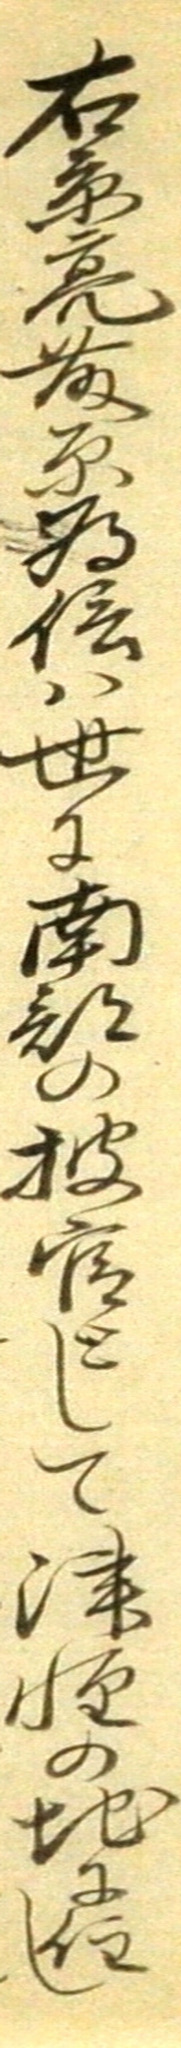右京亮藤原為信は世に南部の被官として津軽の地に住し
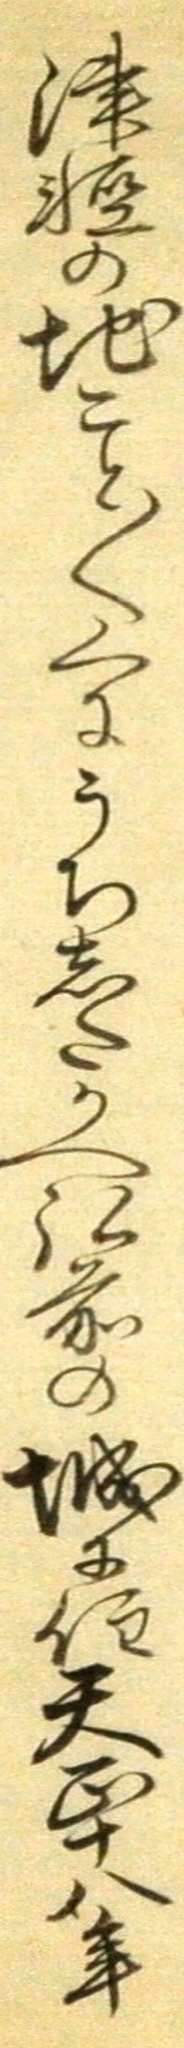津軽の地こと〳〵くにうちしたかへ弘前の城に住天正十八年
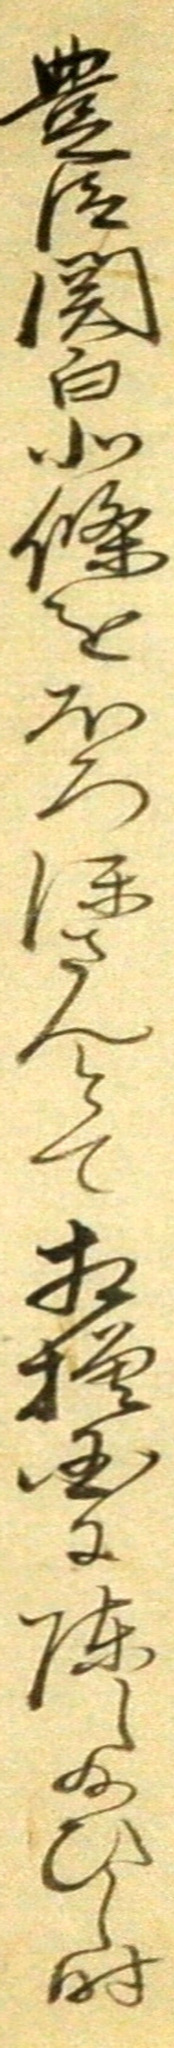豊臣関白北条をほろほさんとて相模国に陣し給ひし時
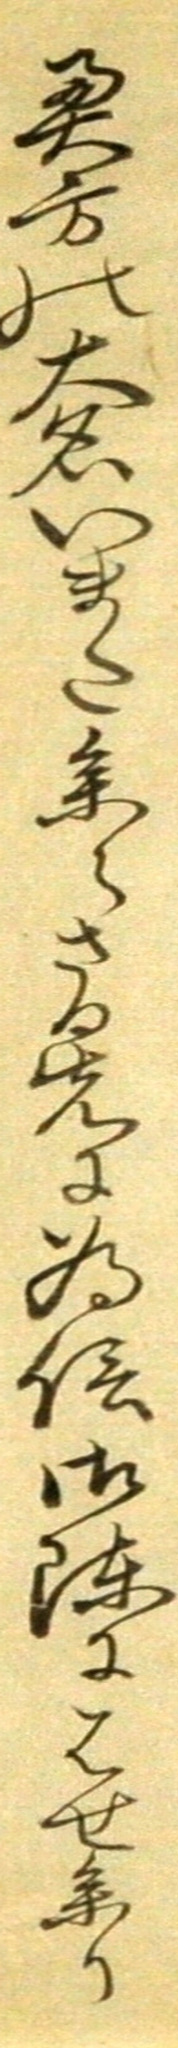奥方の大名いまた参らさる先に為信御陣にはせ参り
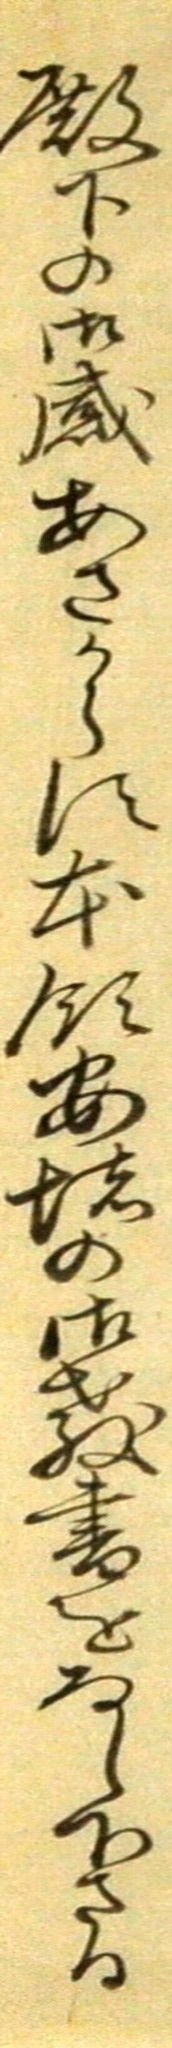殿下の御感あさからす本領安堵の御教書をなし下さる
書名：藩翰譜（九・下）
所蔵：伊那市立高遠町図書館・合同会社AMANE
